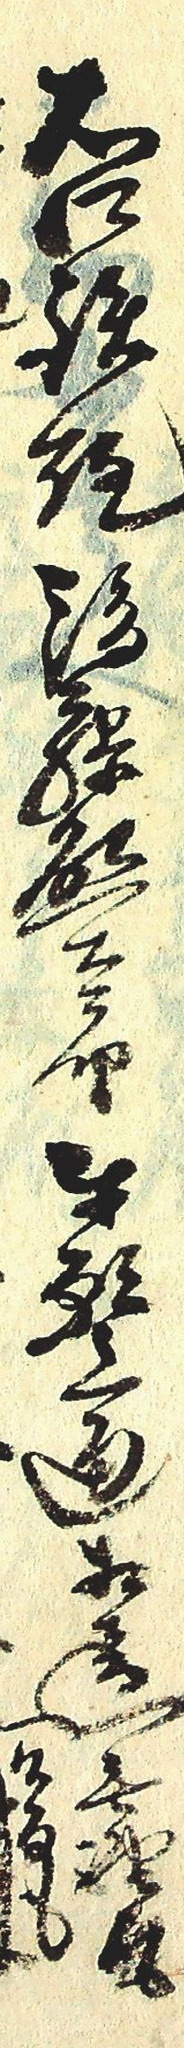右郷鉄炮後藤熊太郎奉願上通相違無御座候
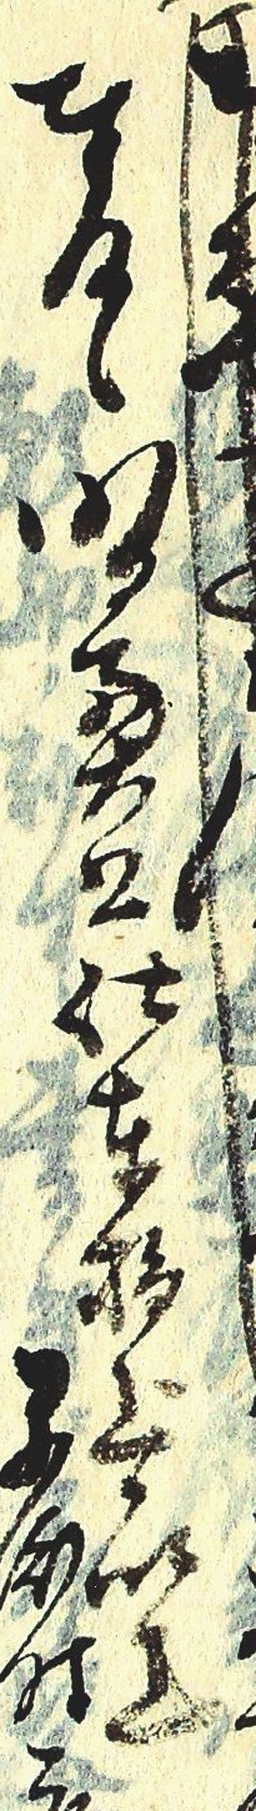奉存候仍て奥書仕奉指上候以上
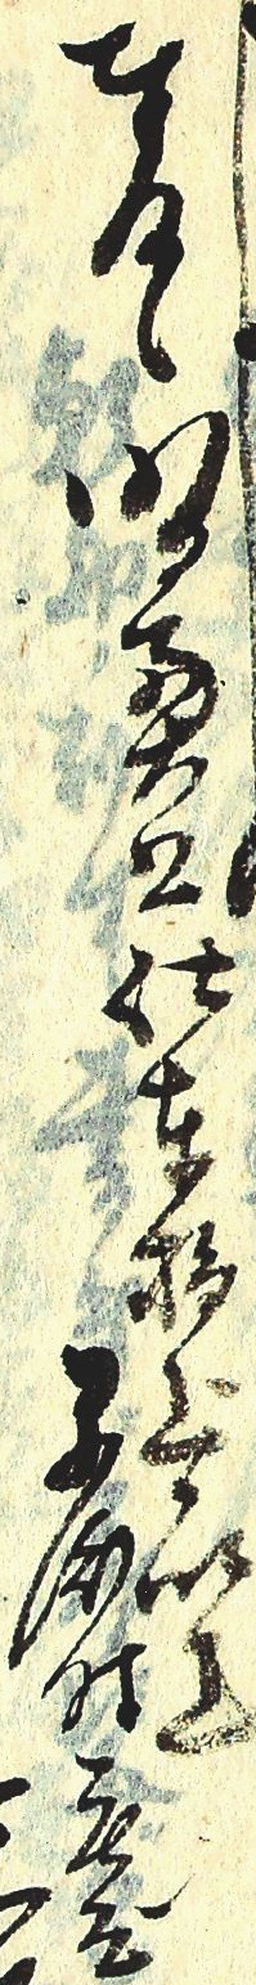奉存候仍て奥書仕奉指上候以上
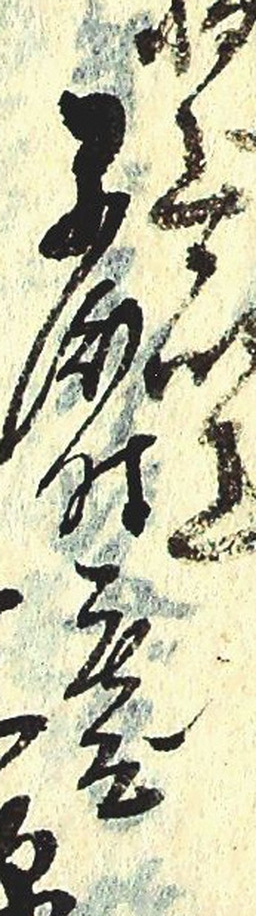早淵村庄屋
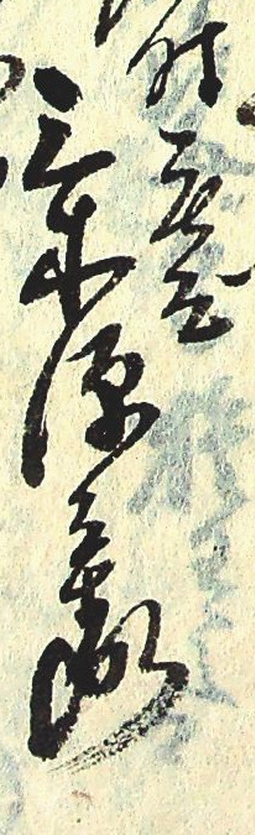三木源兵衛
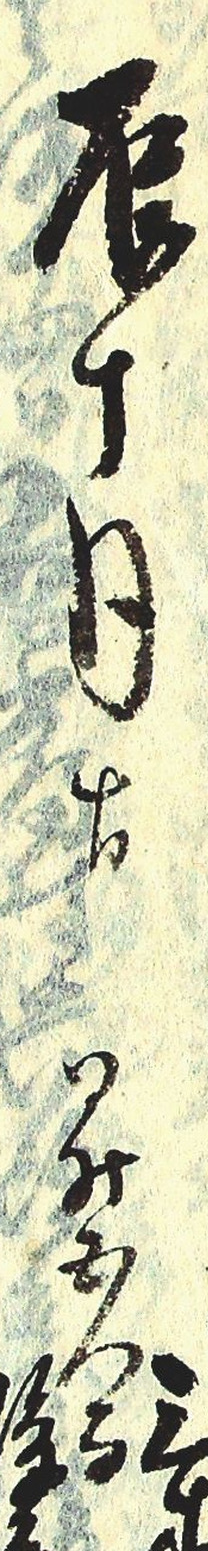辰十月十日同村五人与
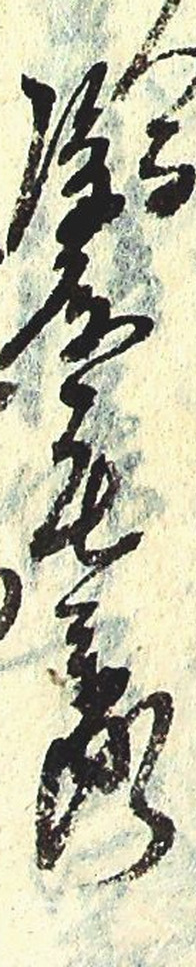後藤庄兵衛

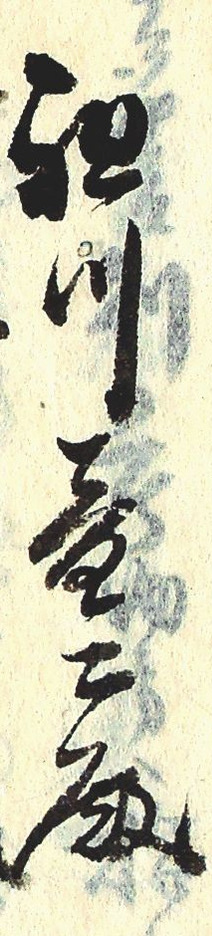祖川益二殿
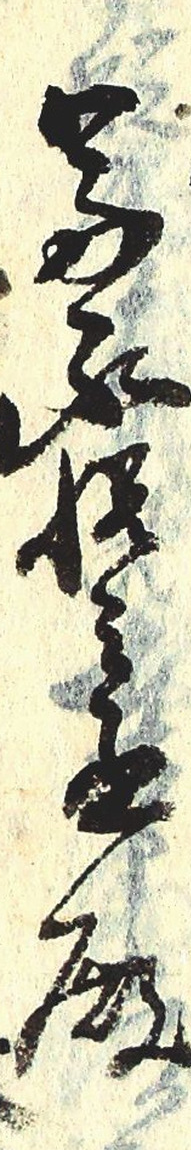富永悦之丞殿
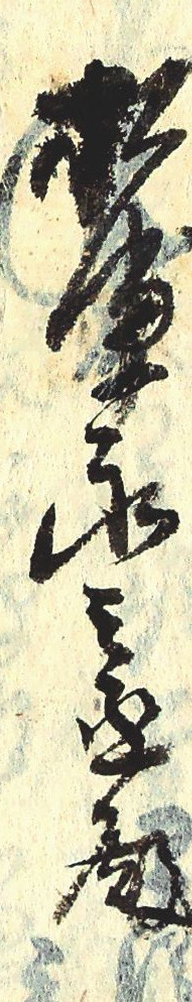松浦永之丞殿
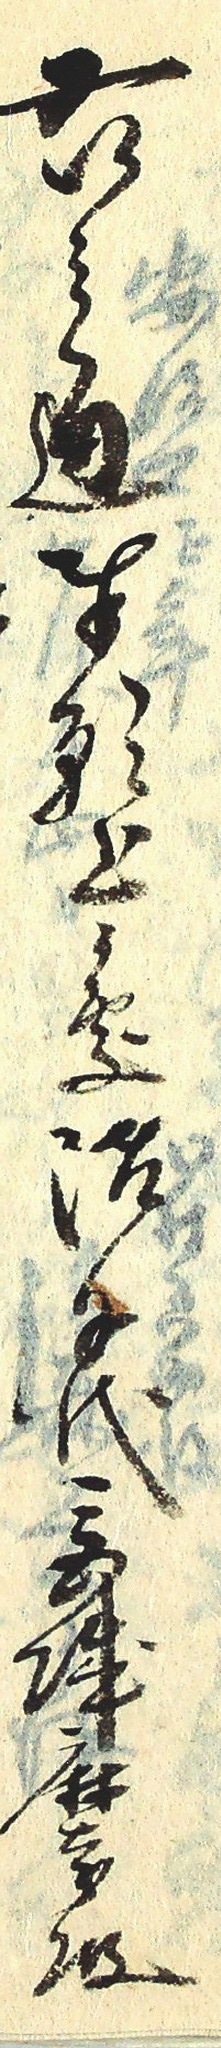右之通奉願上候処御手代宮城麻太郎殿
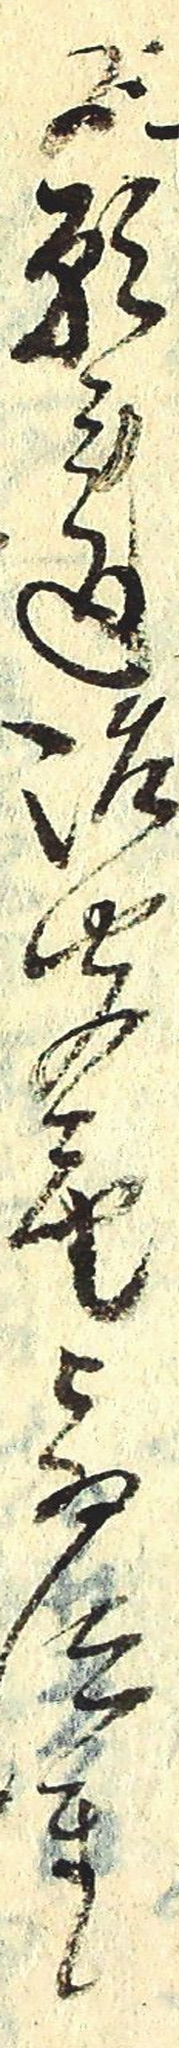ゟ願之通御聞届被為仰付候
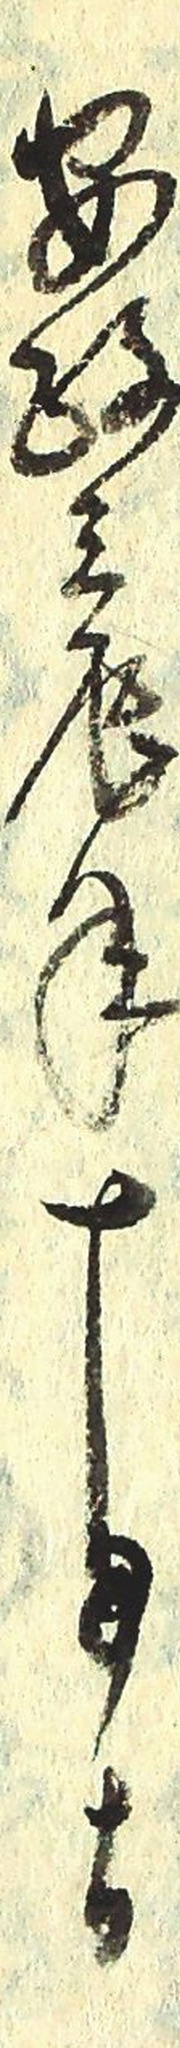安政三辰年十月十日
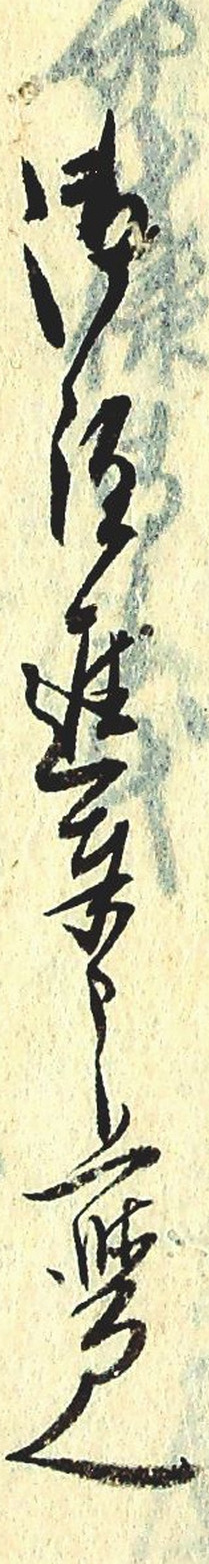御注進奉申上覚
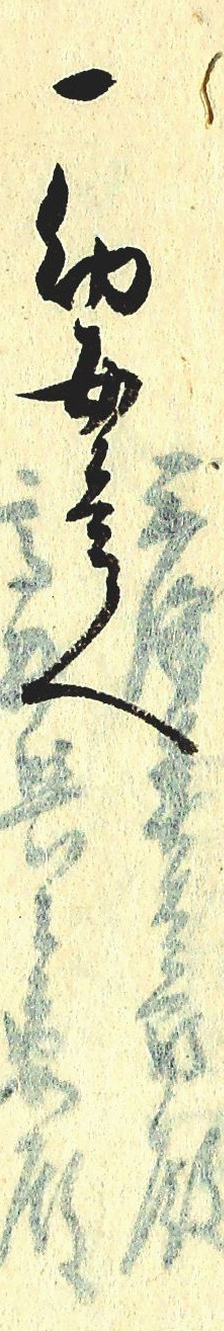一幼女壱人
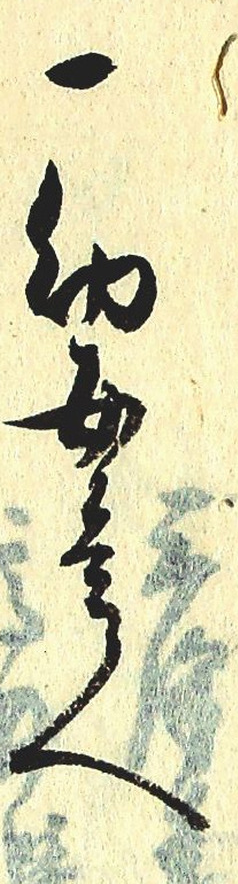一幼女壱人
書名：諸御願書控(弐番）
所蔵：鳴門教育大学 Naruto University of Education
